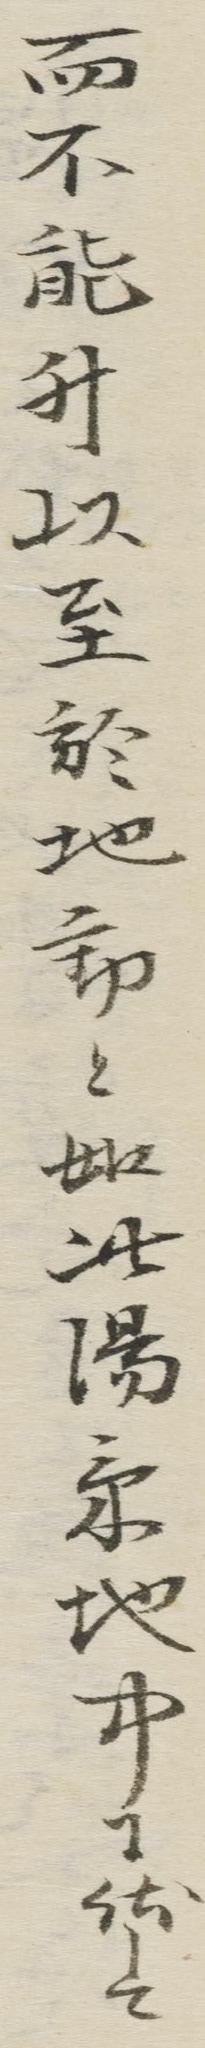而不能升以至於地動と如此陽気地中に伏して
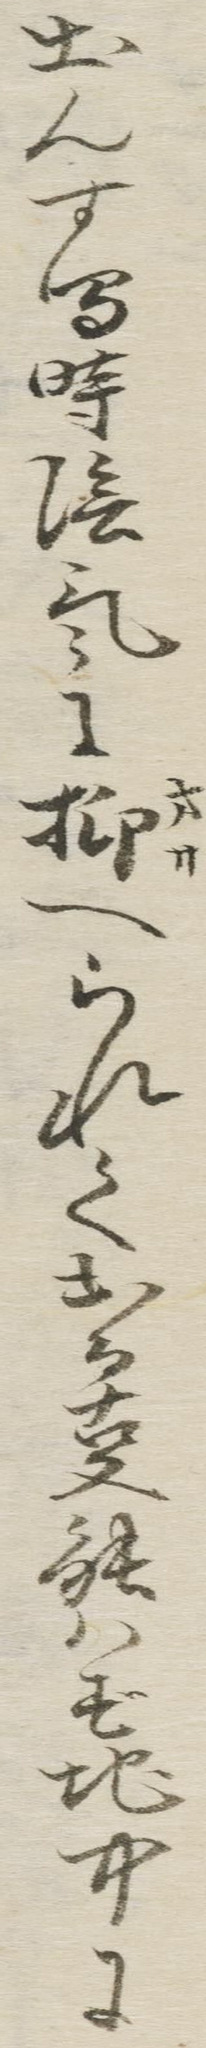出んする時陽気に抑えられて出る事能ハず地中に
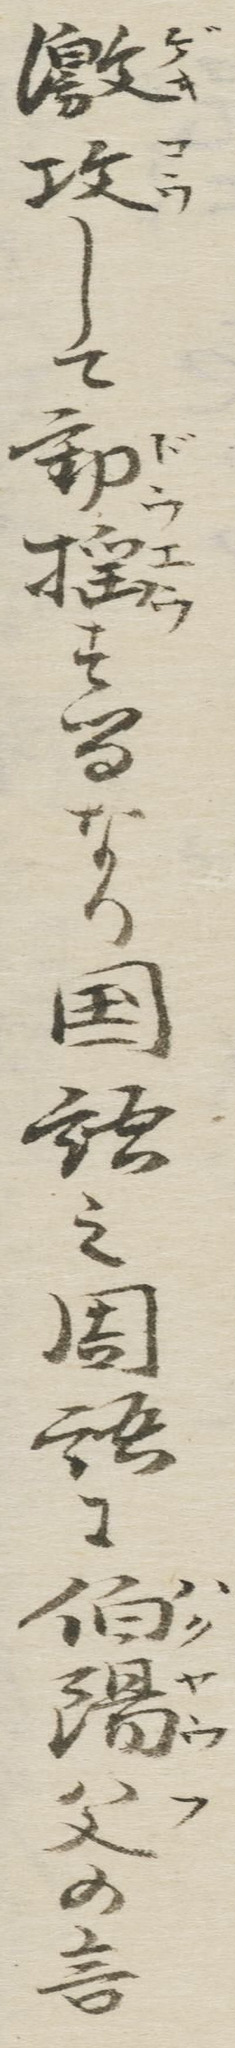激攻して動揺するなり国語に伯陽父の言
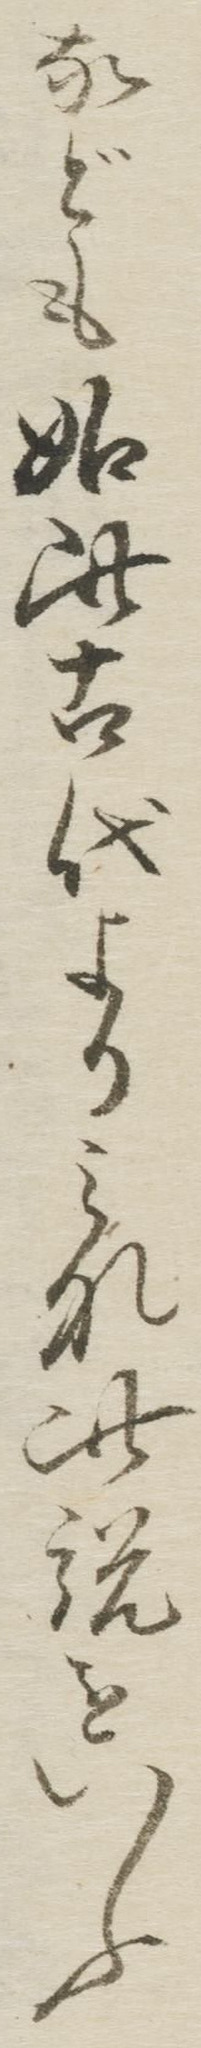なども如此古代よりみな此説をいふ
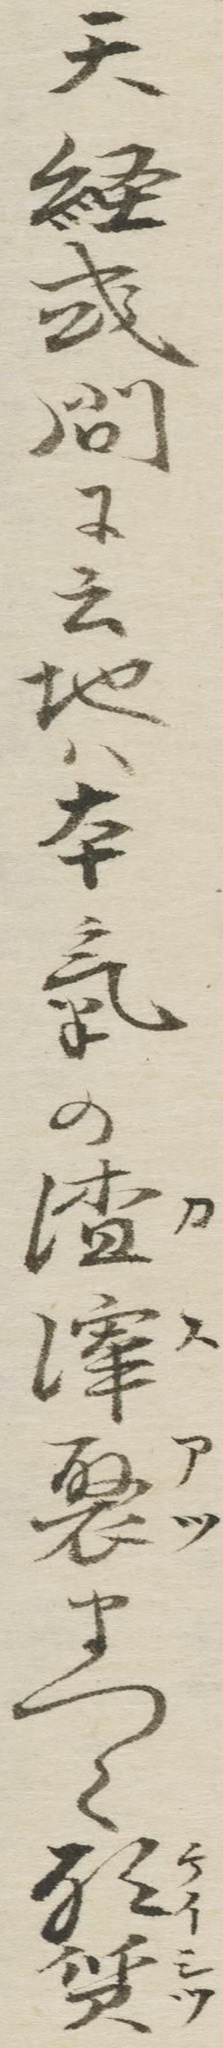天経或問に云地ハ本気の渣滓裂まつて形質
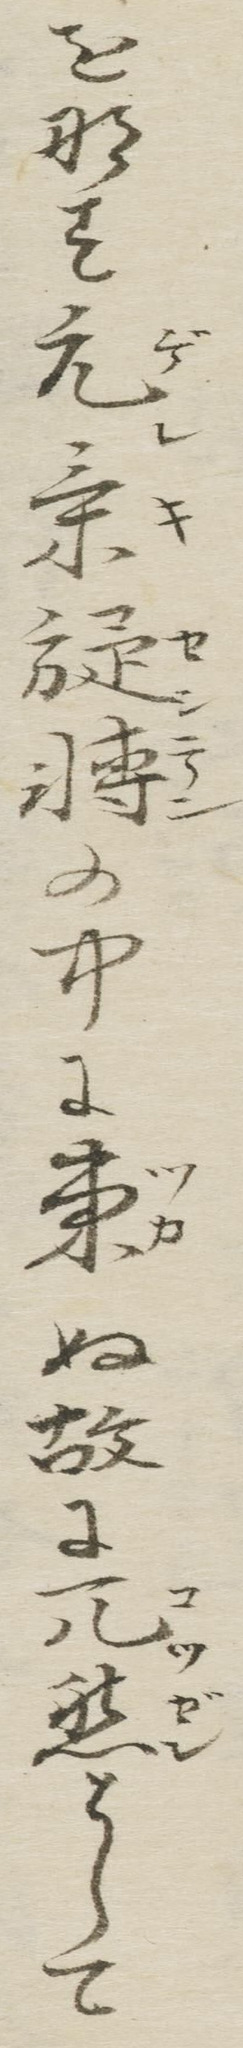をなす元気旋轉の中に束ぬ故に兀然として
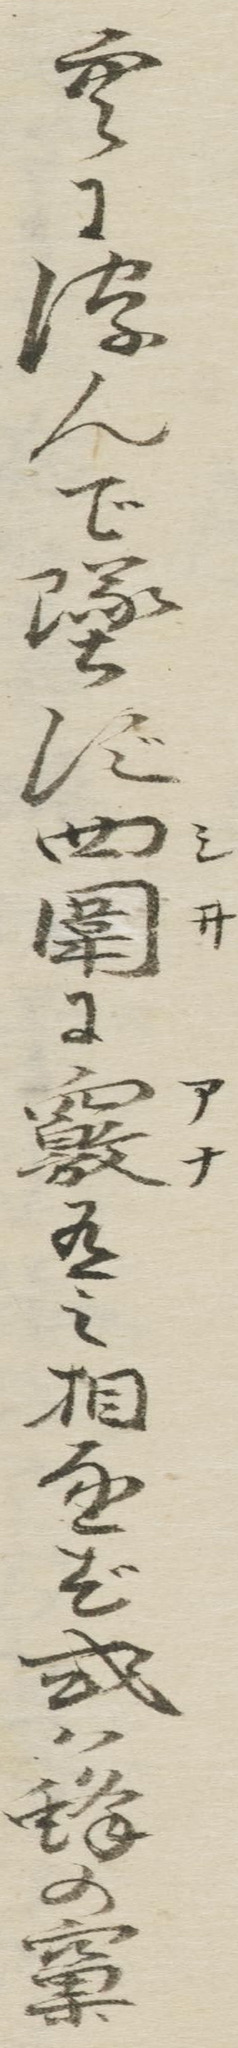空に浮んで墜ず四囲に竅有之相遂或ハ蜂の巣

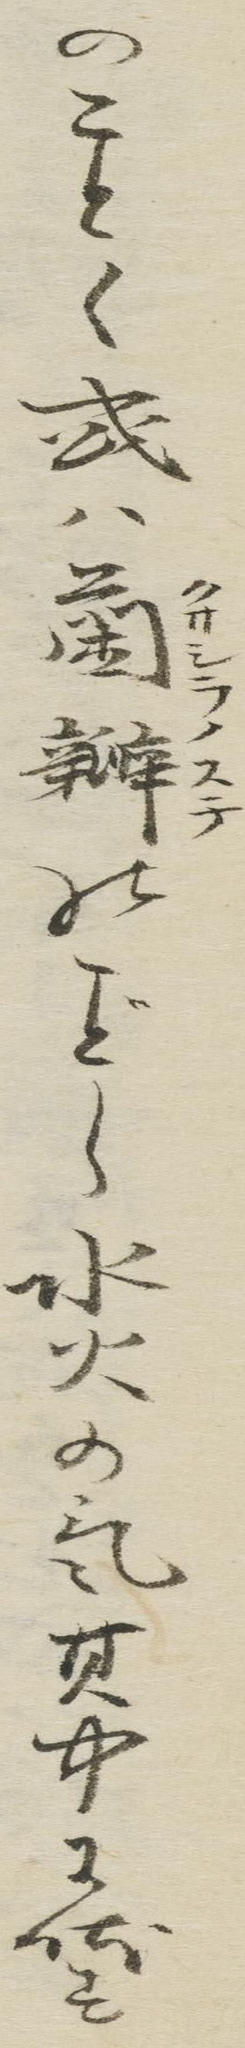のごとく或ハ菌辨のごとし水火の気其中に伏す
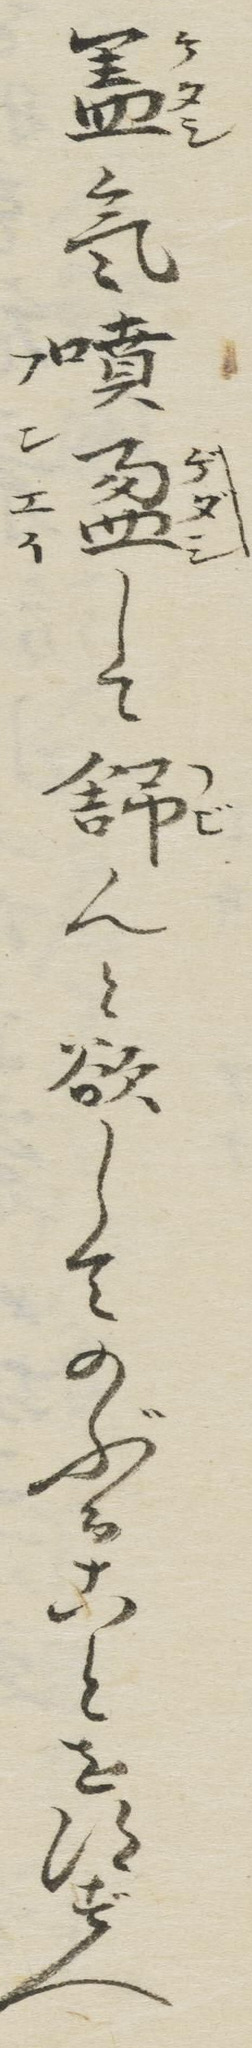蓋気噴盈して舒んと欲しのぶることを得ず人
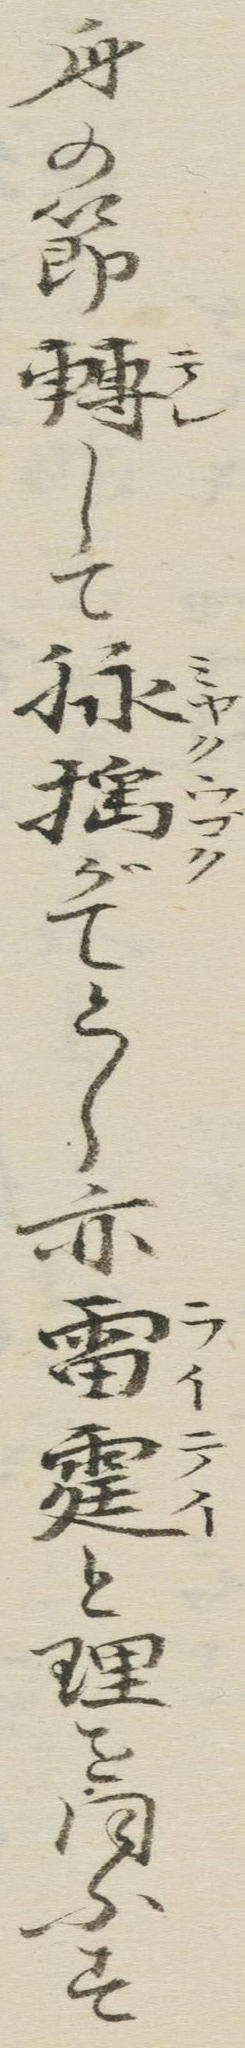身の節轉して脉揺がことし亦雷霆と理を同ふす
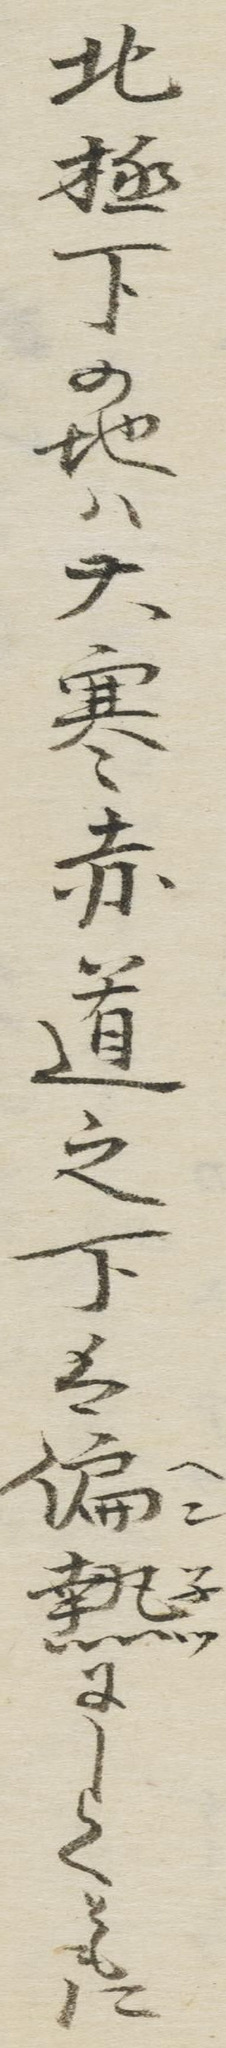北極下の地ハ大寒赤道之下は偏熱にしてともに
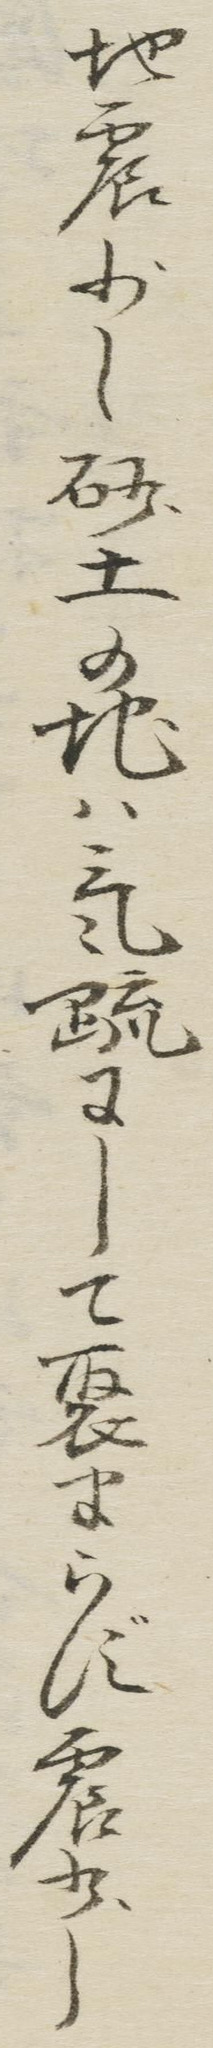地震少し砂土の地ハ気疏にして裂まらず震少し
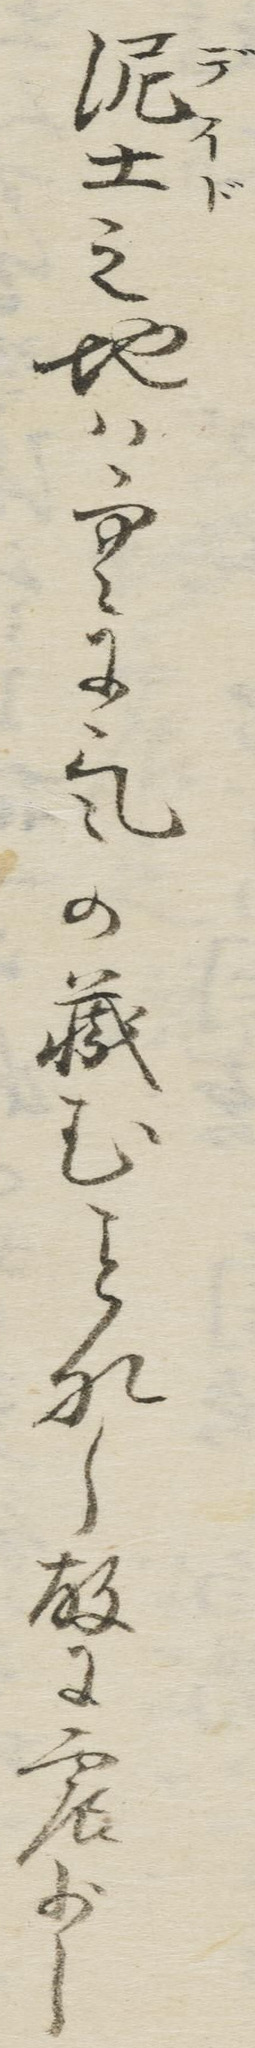泥土之地ハ空に気の蔵むことなし故に震少し
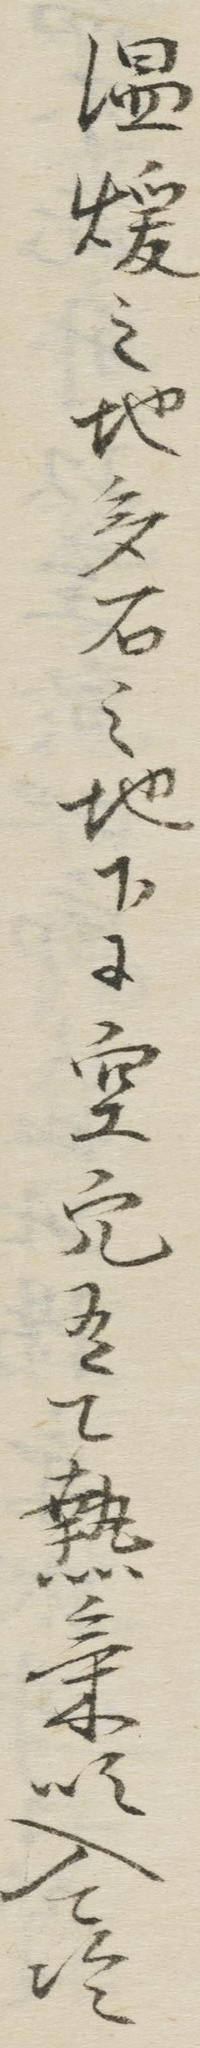温煖之地多石之地下に空穴有て熱気吹入て冷
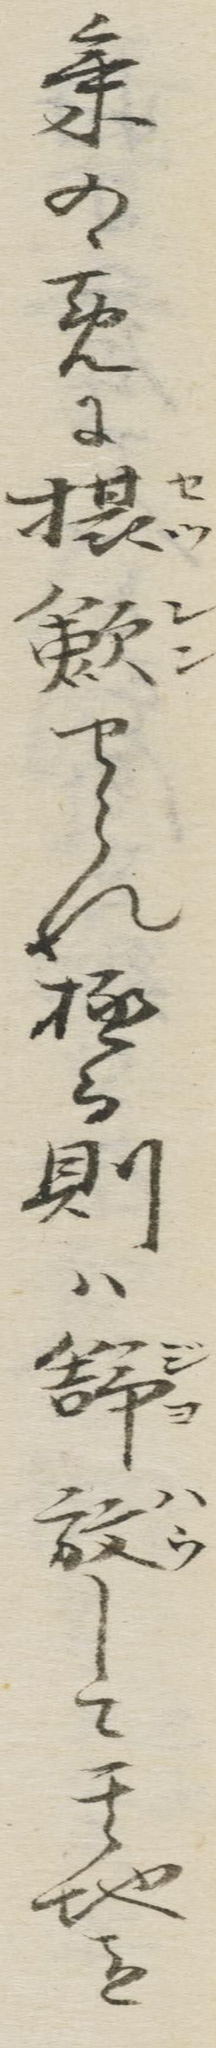気のために摂斂セられ極而則ハ舒放して其地を
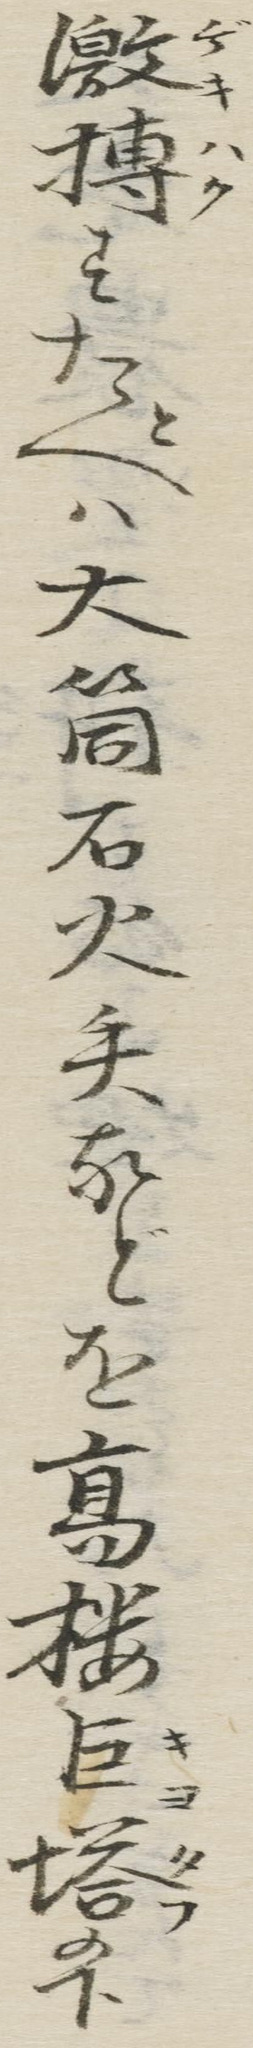激搏すタトヘハ大ツツ筒石火矢などを高楼巨塔の下
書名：諸国大地震大津波一代記
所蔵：東京大学地震研究所図書室 Earthquake Research Institute Library, The University of Tokyo, JAPAN
